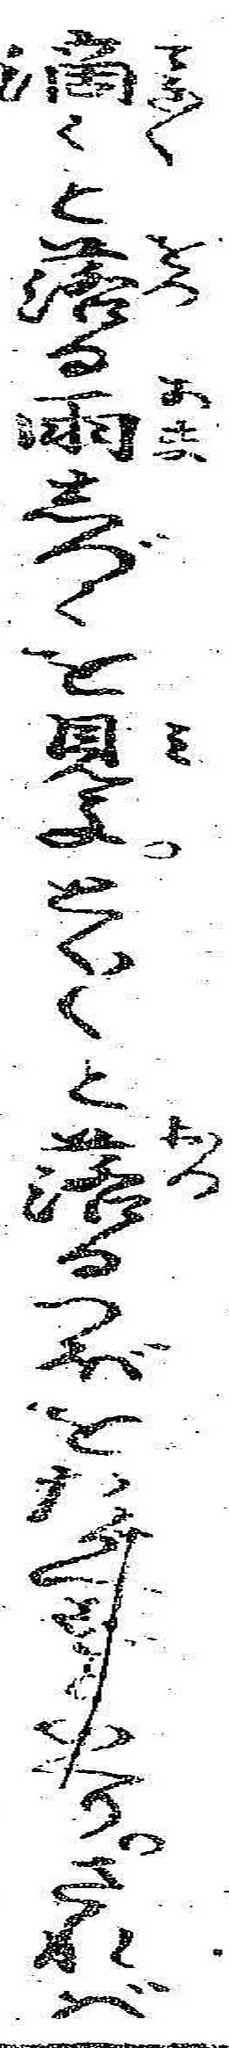滴々と落る雨しづくを見よ。とく〳〵と落るつぼをたがへずといへり。されば
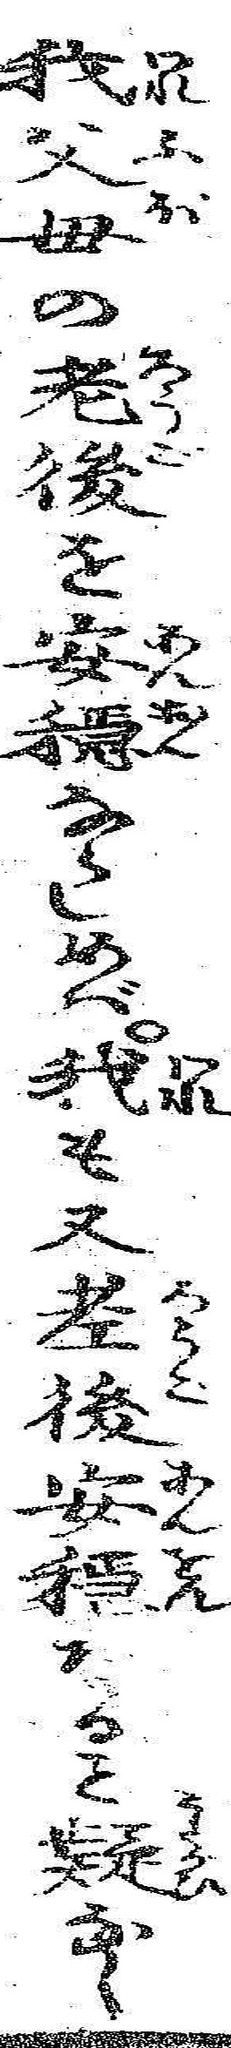我父母の老後を安穏ならしめば。我も又老後安穏なること疑なし
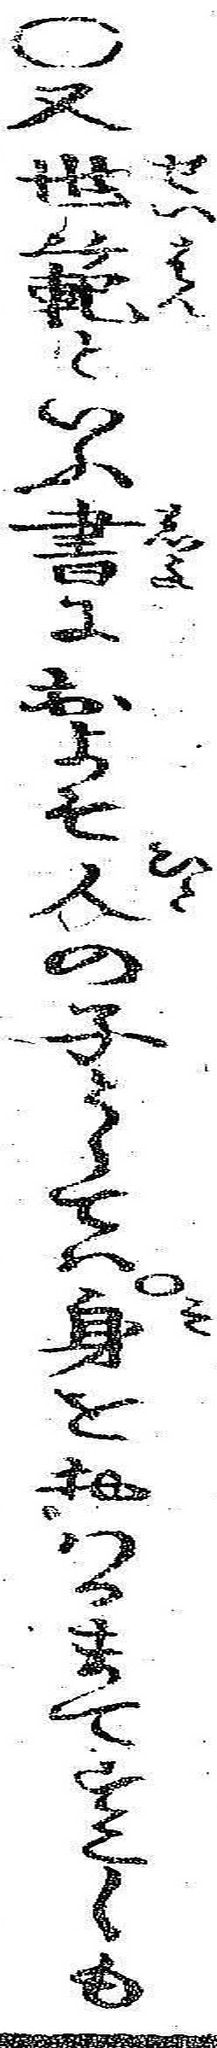○又世範といふ書におよそ人の子としては。身をおわるまてすこしも
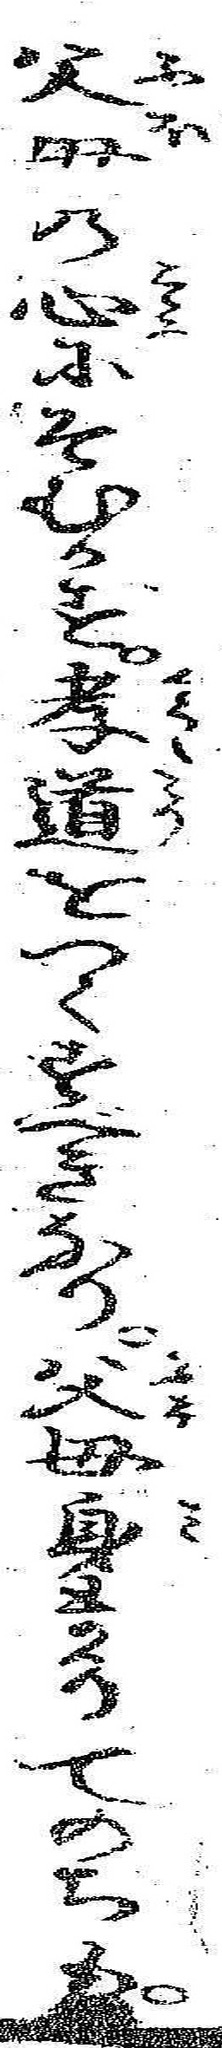父母の心にそむかず。孝道をつくすべきなり。父母身まかりてのちも。
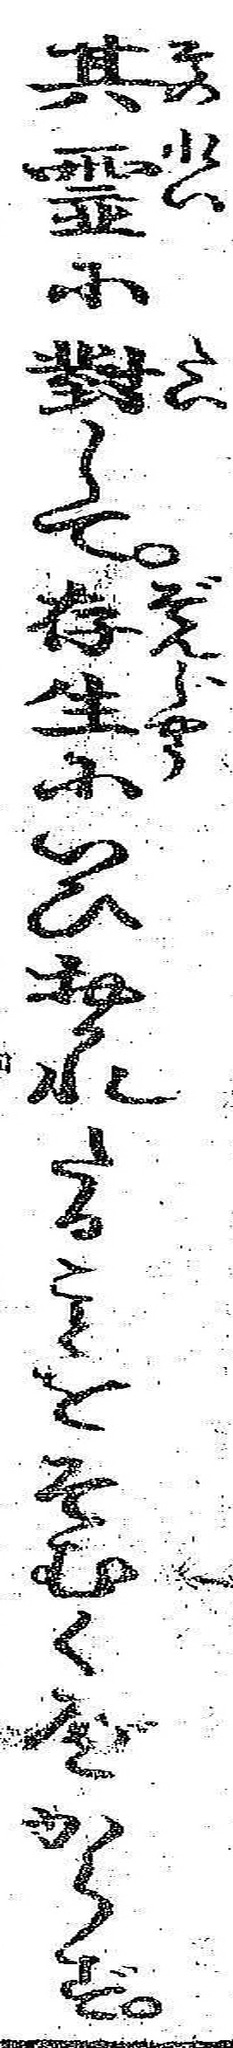其霊に対して。存生にいひおかれたることをそむくべからず。
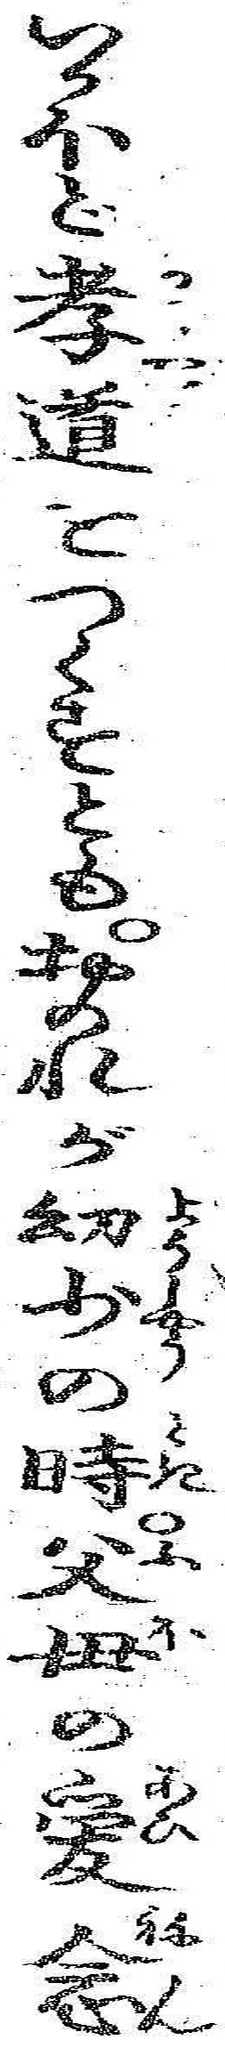いかほど孝道をつくすとも。おのれが幼少の時。父母の愛念
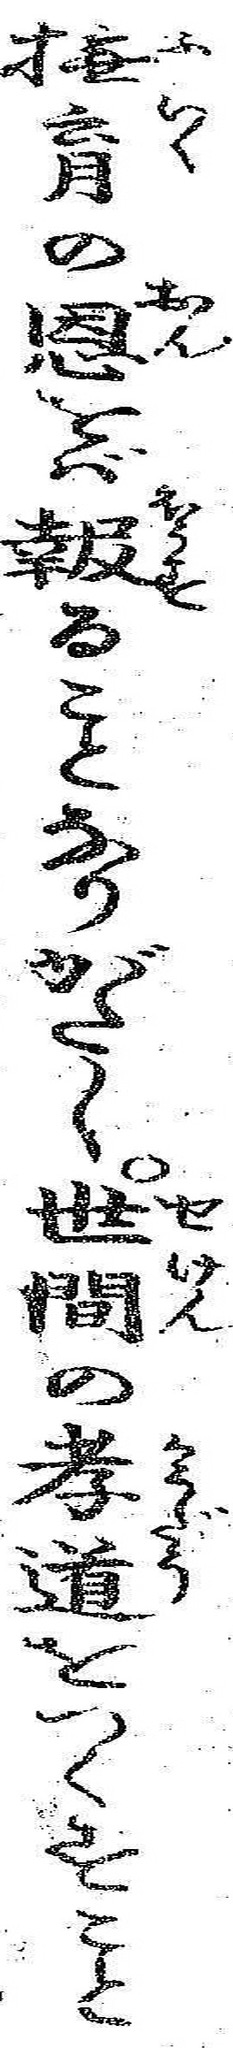撫育の恩をば報ることなりがたし。世間の孝道をつくすこと
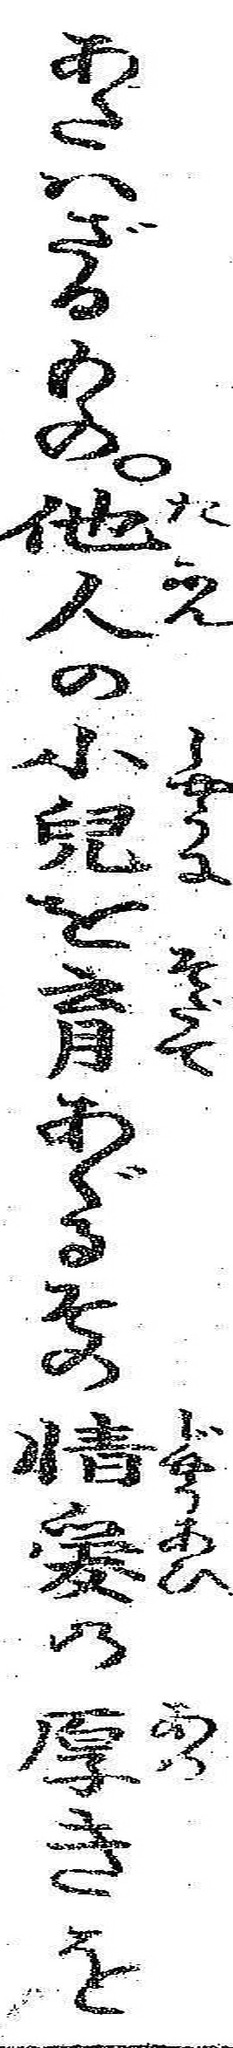あたはざるもの。他人の小児を育あぐるその情愛の厚きを
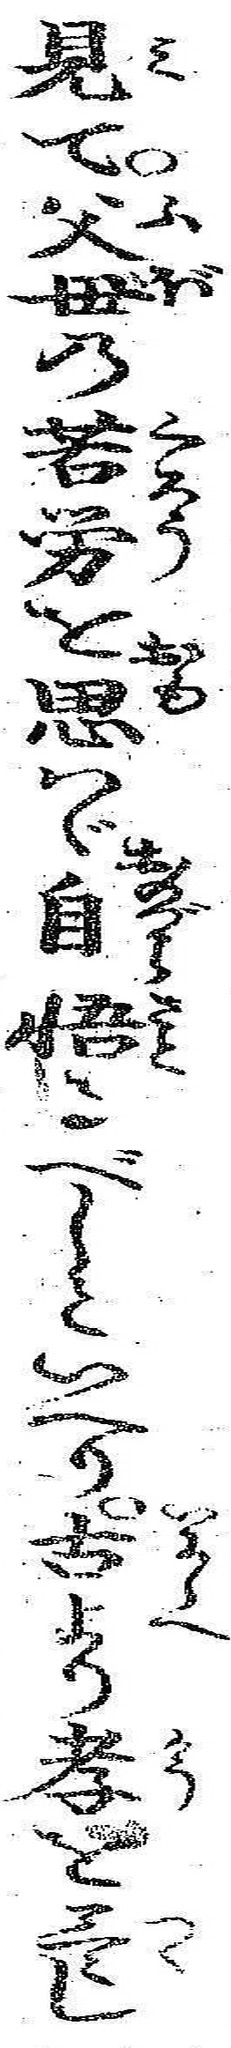見て。父母の苦労を思はゞ自悟るべしといへり。古より孝を尽し
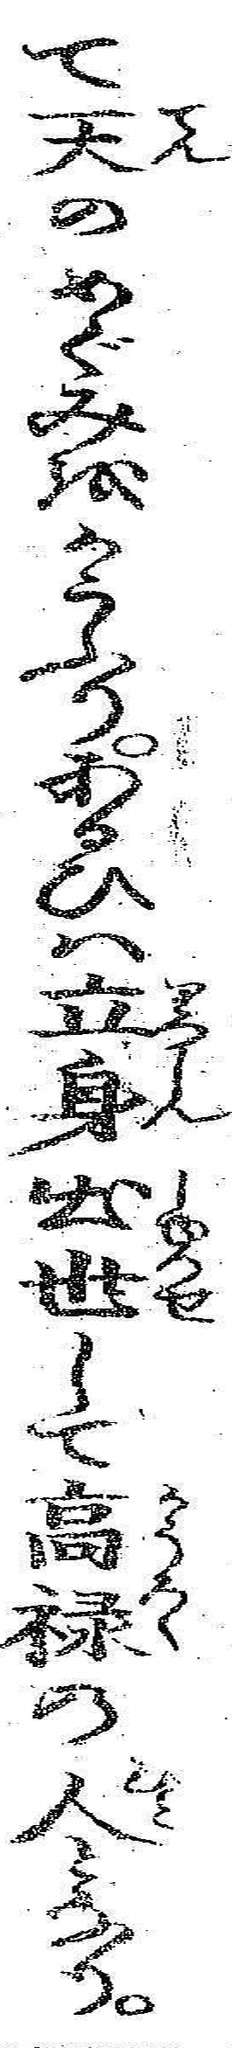て天のめぐみをかうふり。あるひは立身出世して高禄の人となり。
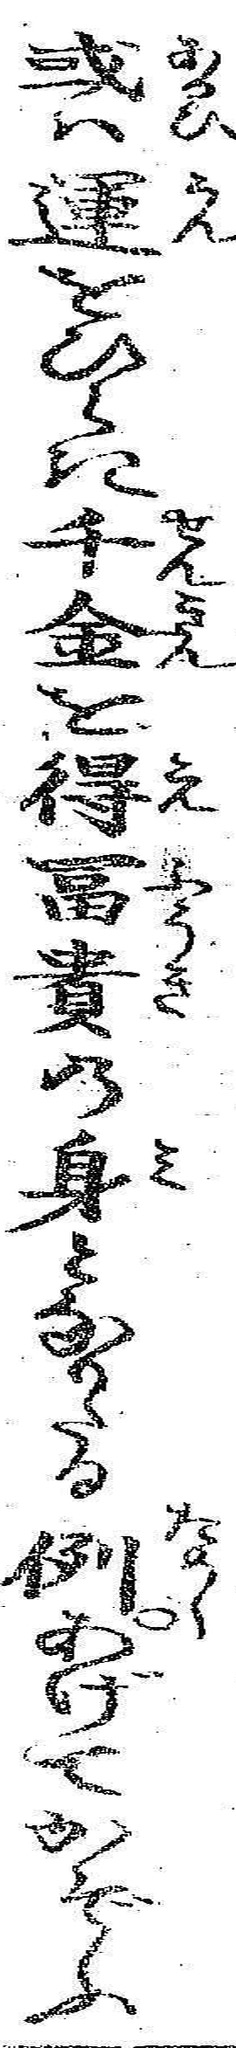或は運をひらき千金を得富貴の身となりたる例。あげてかぞふ
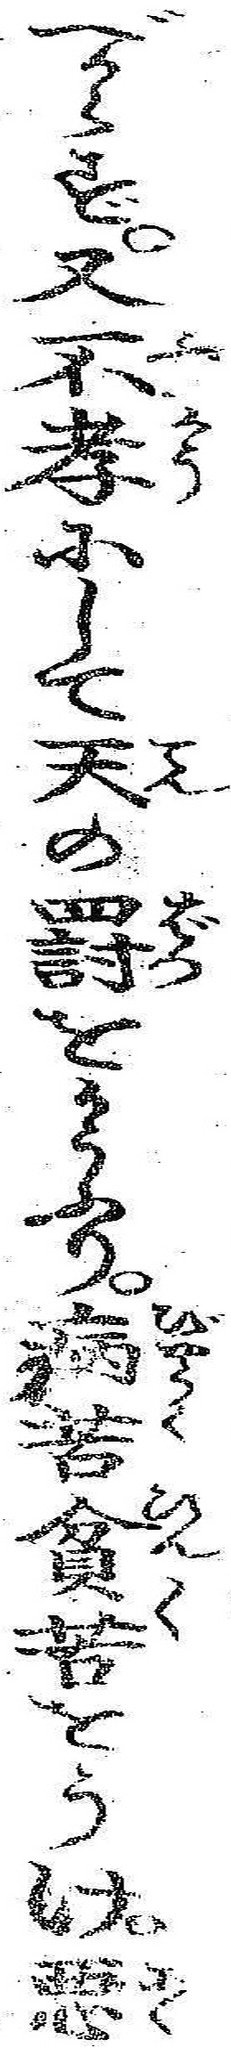べからず。又不孝にして天の罰をかうふり。病苦貧苦をうけ。悪
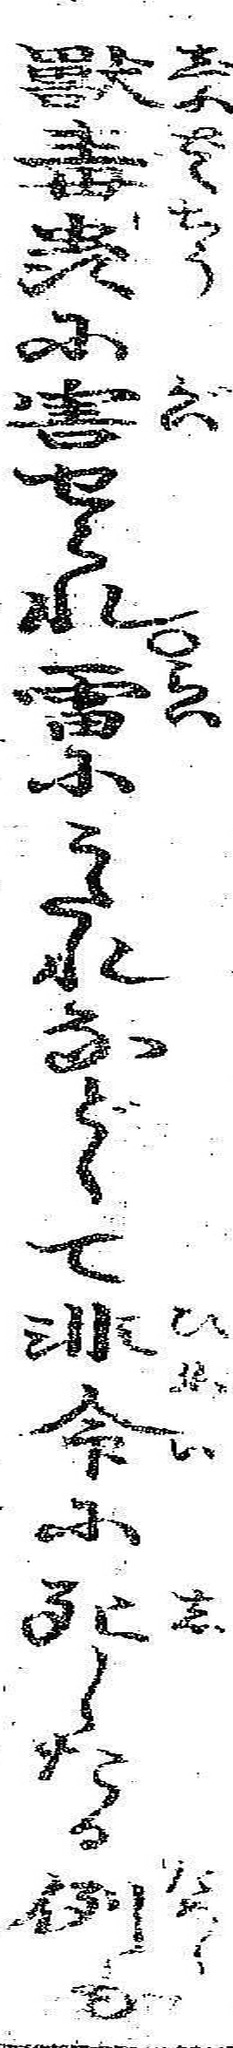獣毒虫に害せられ。雷にうたれなどして非命に死したる例も
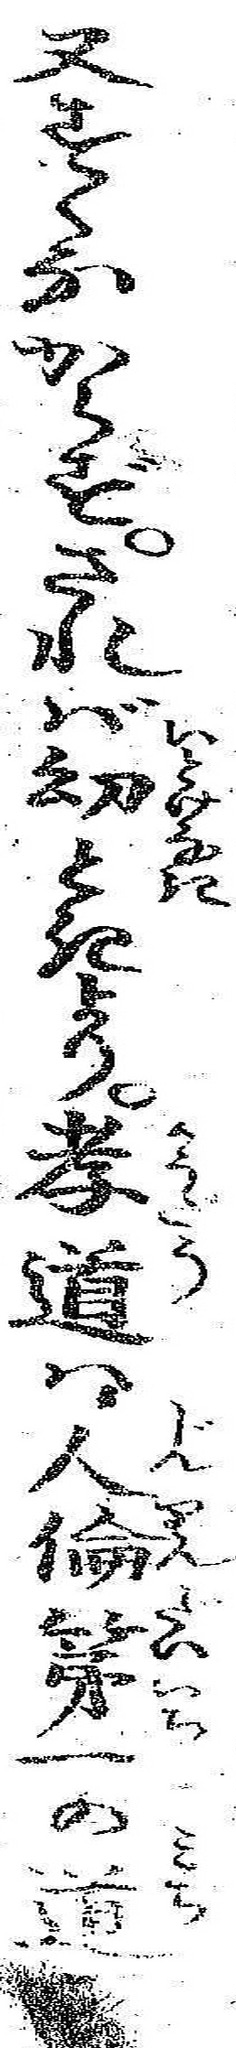又すくなからず。されば幼ときより。孝道は人倫第一の道
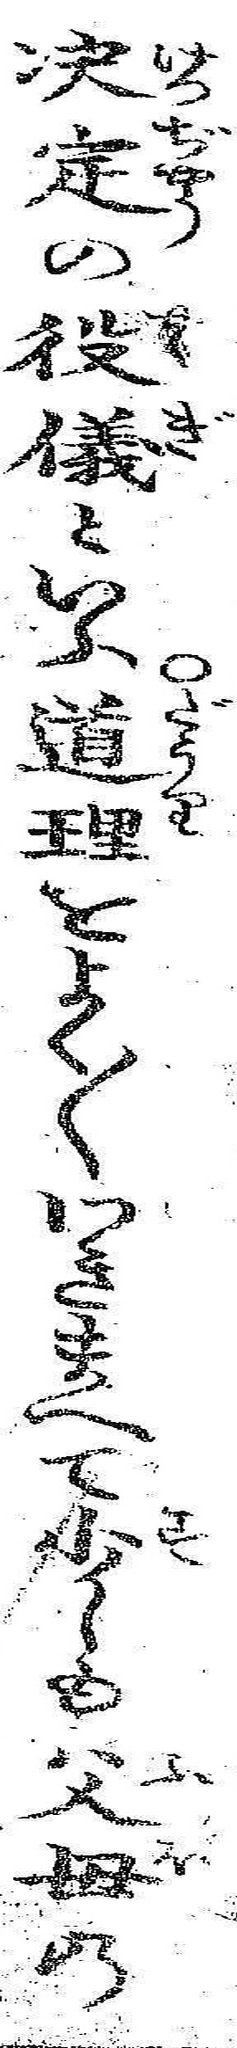決定の役儀といふ。道理をよく〳〵わきまへて少しも父母の

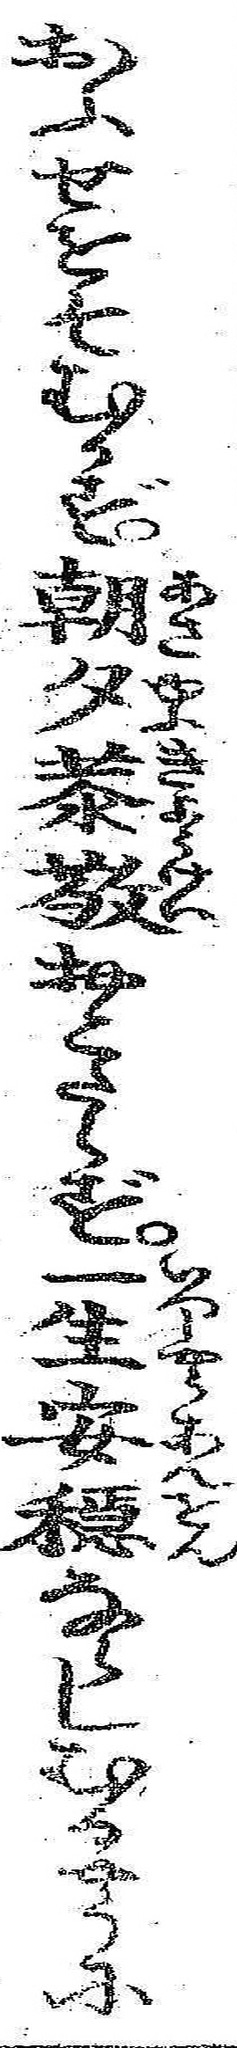おふせをそむかず。朝夕恭敬おこたらず。一生安穏ならしむるやうに
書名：昔話稲妻表紙
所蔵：国文学研究資料館
